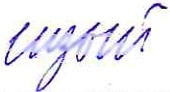сизый
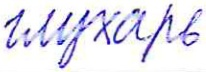глухарь
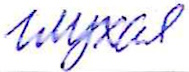глухая
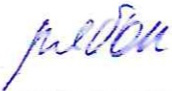рябок
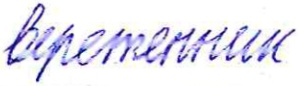веретенник
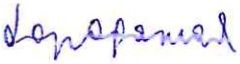боподатая
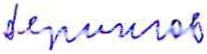берингов
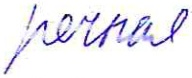речная
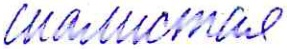скалистая
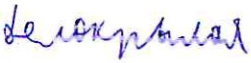белокрылая
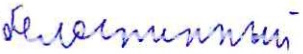белоспинный
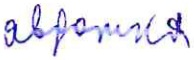авдотка
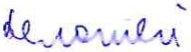белошей
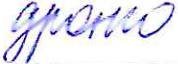дронго
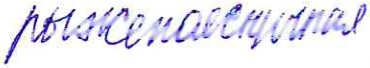рыжепоясничная
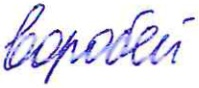воробей
